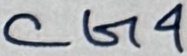сыч
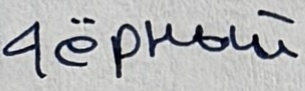чёрный
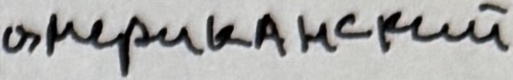американский
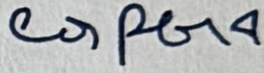сарыч
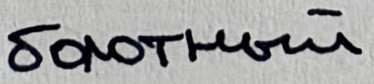болотный
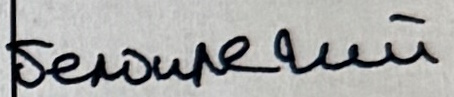белоплечий
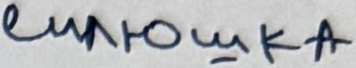сплюшка
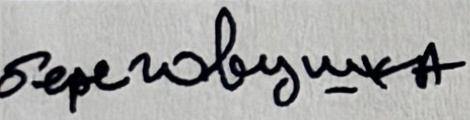береговушка
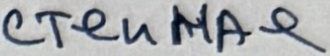степная
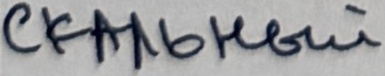скальный
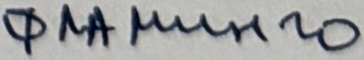фламинго
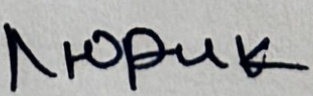люрик
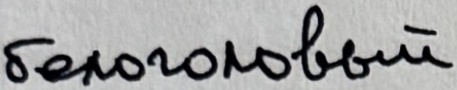белоголовый
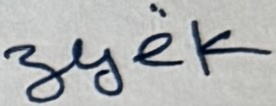зуёк
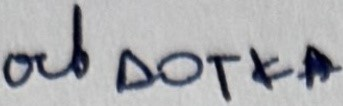авдотка
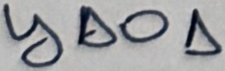удод
